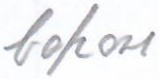ворон
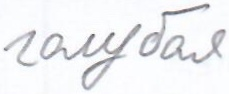голубая
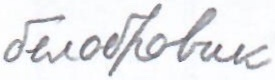белобровик
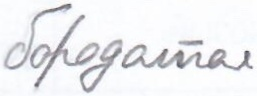бородатая
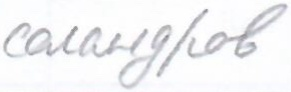соландров
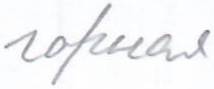горная
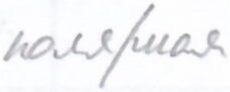полярная
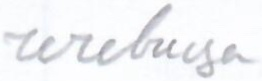чечевица
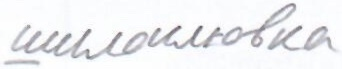шилоклювка
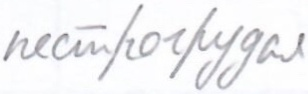пестрогрудая
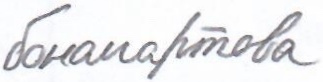бонапартова
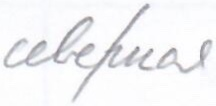северная
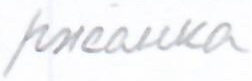ржанка
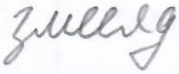змееяд
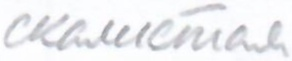скалистая
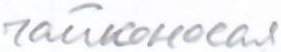чайконосая
